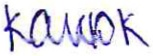канюк
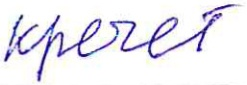кречет
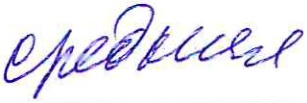средняя
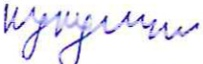кукушки
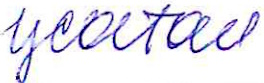усатая
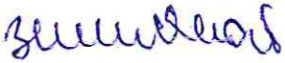земляной
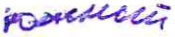южный
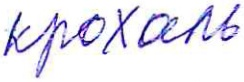крохаль
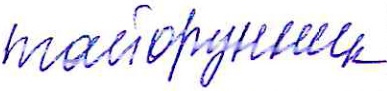тайфунник
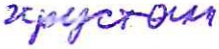хрустан
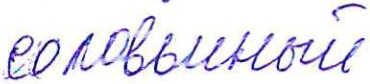соловьиный
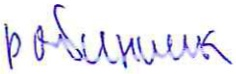рабинник
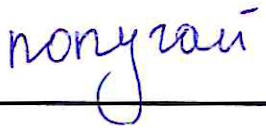попугай
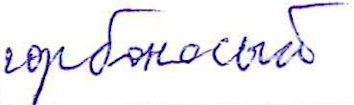горбоносый
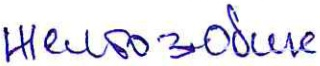желтозобик
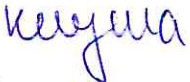клуша
